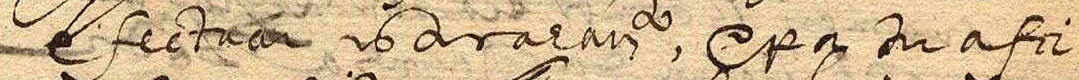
efectuar este cazamto, e por ter afei
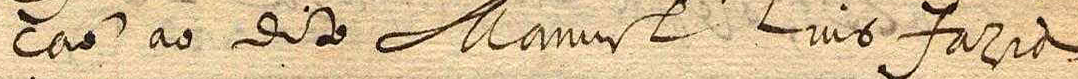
çaoõ ao dito Manuel Luis fazia
